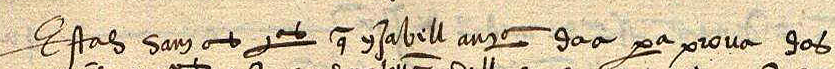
Estas sam as tas q̄ ysabell anta daa ꝑa proua dos
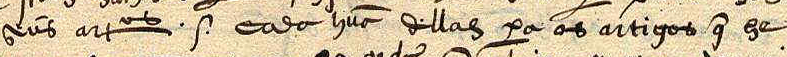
seus artos .s. cada hūa dellas ꝑa os artigos q̄ he
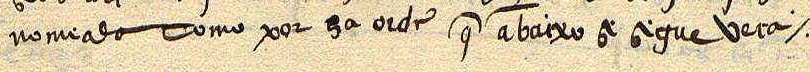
nomeada como por ha ordē q̄ abaixo se segue vera /.
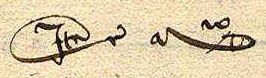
Jtē ē aVro
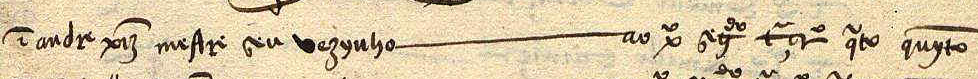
item andre pīz mestre seu vezynho – ao po segdo t̄cro q̄to qūyto
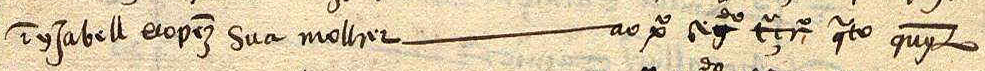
item yJsabell llopēz Sua molher – ao po segdo t̄cro q̄to qūyto
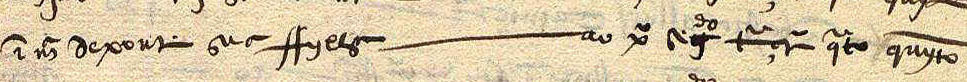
item ma de ponte sua ffylha – ao po segdo t̄cro q̄to qūyto
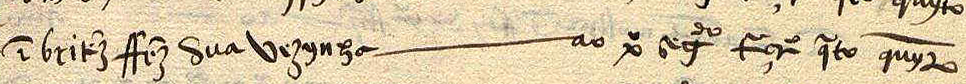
item britez ffēz Sua vezynha – ao po segdo t̄cro q̄to qūyto
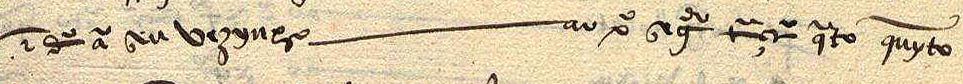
item do ao seu vezynho – ao po segdo t̄cro q̄to qūyto
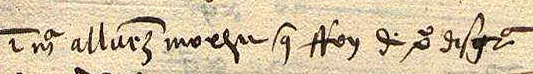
item ma alluēz molher q̄ ffoy de po desgra
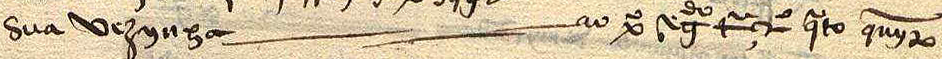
Sua vezynha – ao po segdo t̄cro q̄to qūyto
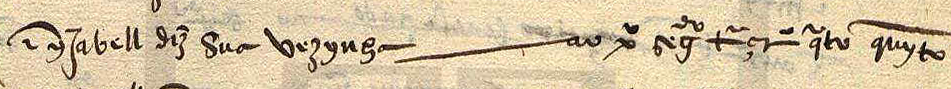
item yJabell diz Sua vezynha – ao po segdo t̄cro q̄to qūyto
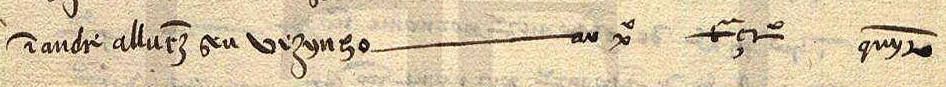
item andre alluēz seu vezynho ao po t̄cro qūyto
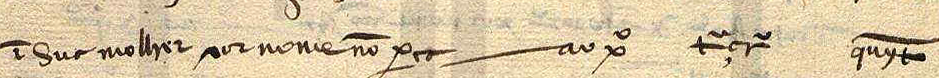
item Sua molher por nome n̄o ꝑca – ao po t̄cro q̄uyto
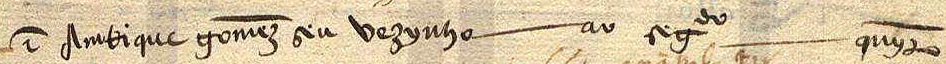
item AmRique gomez seu vezynho – ao segdo qūyto
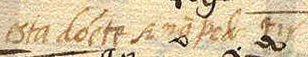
esta doēte e nō pode vir
